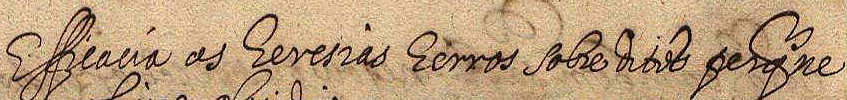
Efficacia as heresias E erros sobreditos per q̄ ne
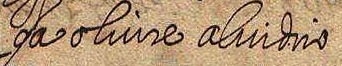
ga o liure aluidrio
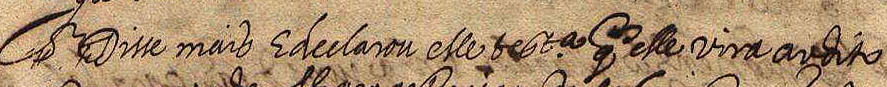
item Disse mais E declarou elle test.a q̄ elle vira ao dito
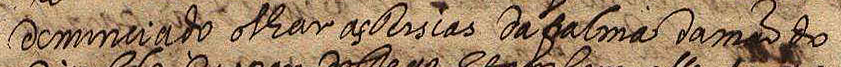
denunciado olhar as Riscas da palma da maõ do
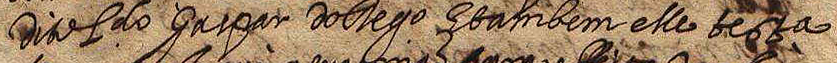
dito Ld.o Gaspar do Rego E tambem elle test.a
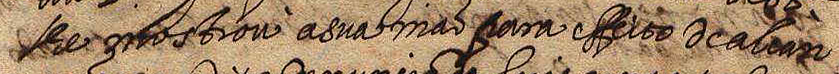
lhe mostrou a sua maõ para effeito de alcan
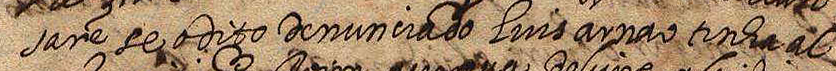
sarē se o dito denunciado Luis arnao tinha al
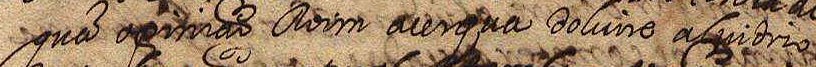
guā opiniaõ Roim acerqua do liure aluidrio
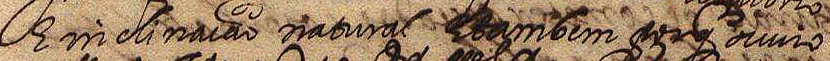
E inclinação natural E tambem porq̄ ouuio
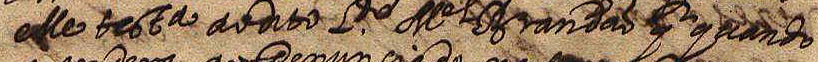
elle testa ao dito L.do Mel Brandaõ q̄ quando
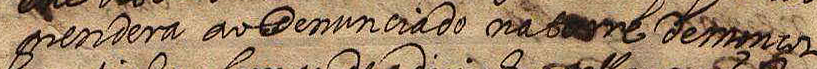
prendera ao Denunciado na torre de moncor
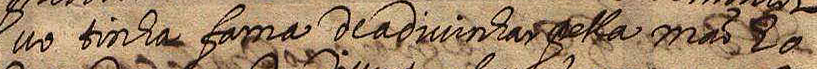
uo tinha fama de adiuinhar pella mão E o
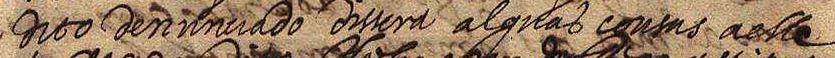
dito denunciado dissera alguas̄ cousas a elle
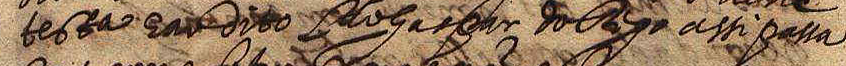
testa E ao dito Ldo Gaspar do Rego assi passa
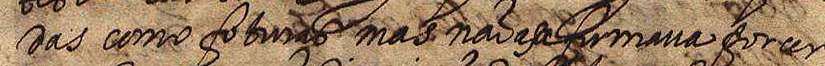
das como foturas mas naõ as afirmaua por cer
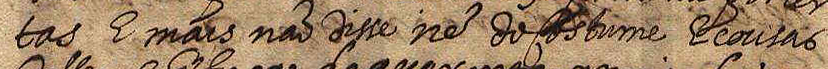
tas E mais naõ disse nē do Costume E cousas
